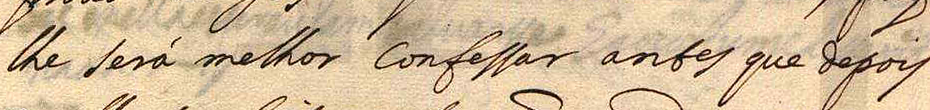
lhe será melhor confessar antes que depois
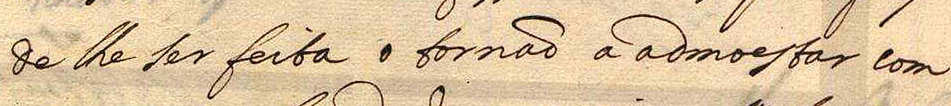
de lhe ser feita o tornão a admoestar com
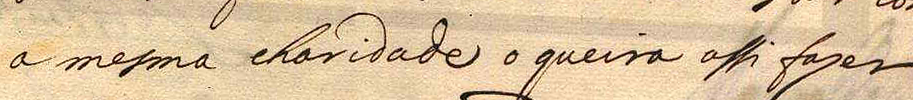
a mesma charidade o queira assi fazer
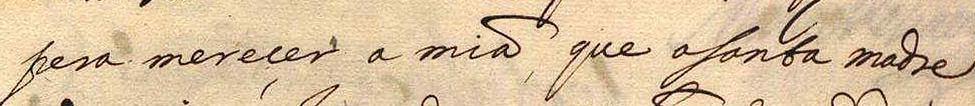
pera mereçer a miā, que a santa madre
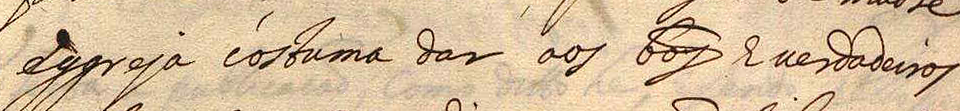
eggreja costuma dar aos bōs E uerdadeiros
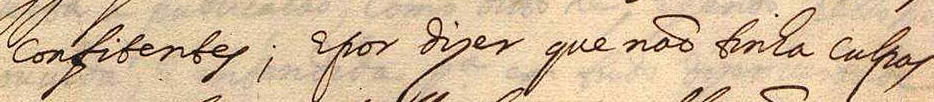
confitentes; E por dizer que não tinha culpas
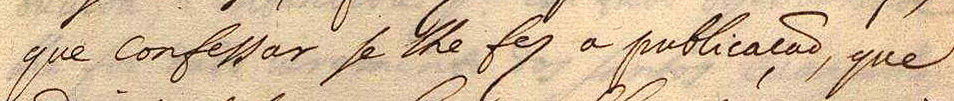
que confessar se lhe fez a publicação, que
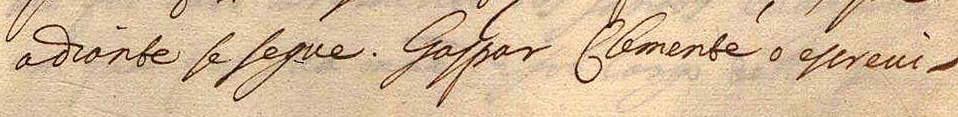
adiante se segue. Gaspar Clemente o escreui
